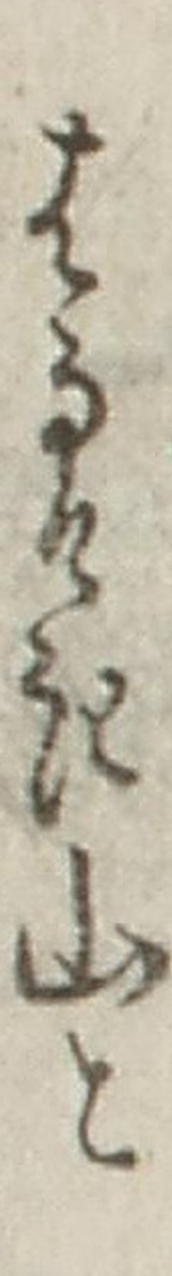はるけき山と
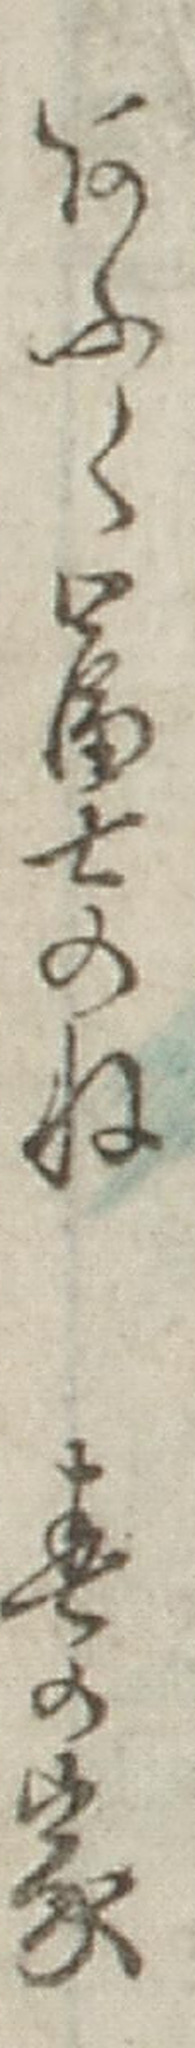あふく冨士のね春の家

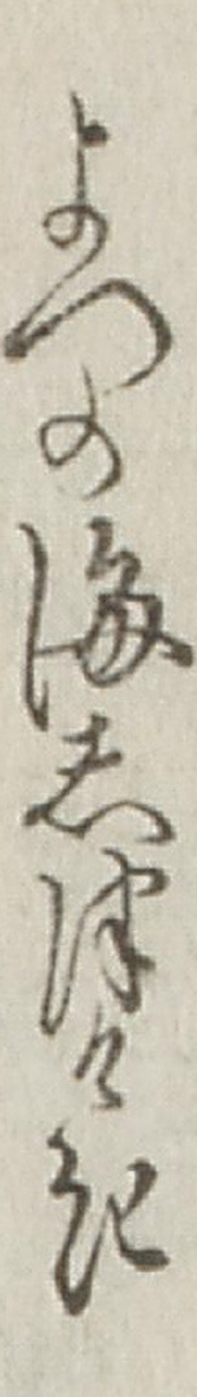よつの海しつけき
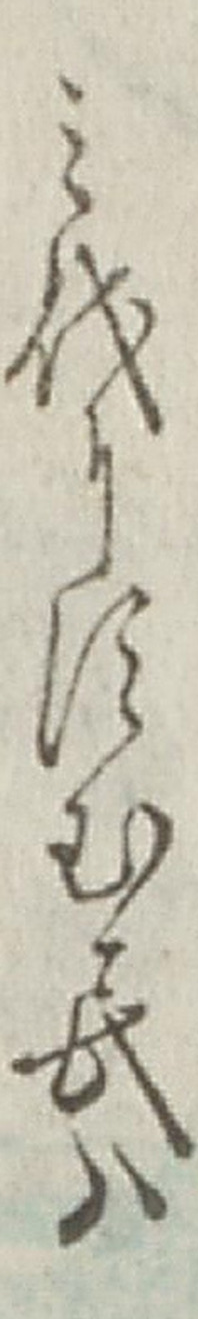ミ代にすむ民ハ
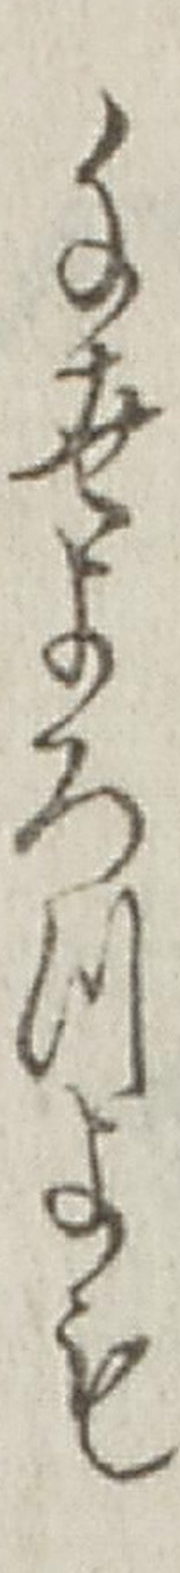千世よろつよも
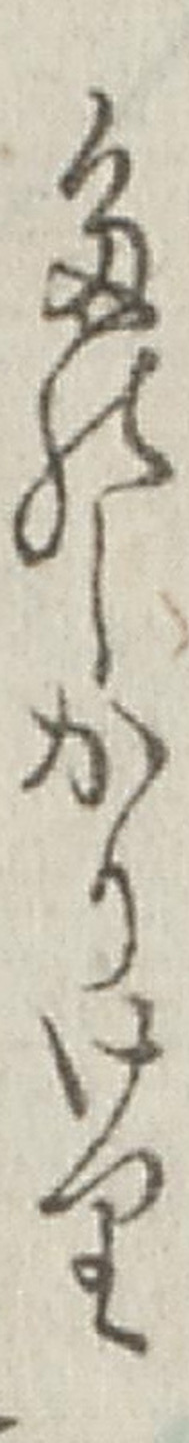たのしかりけり
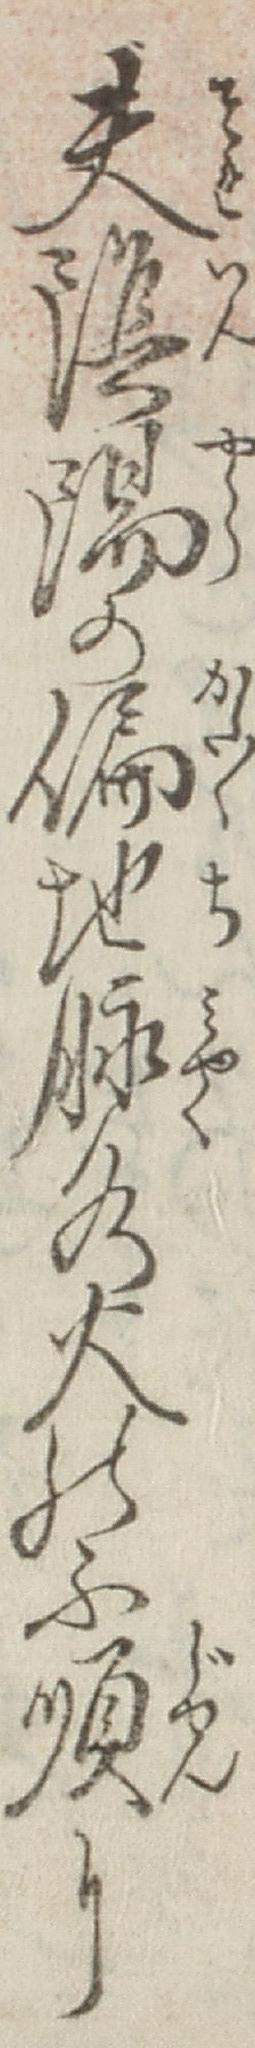夫陰陽の偏地脈水火のふ順に
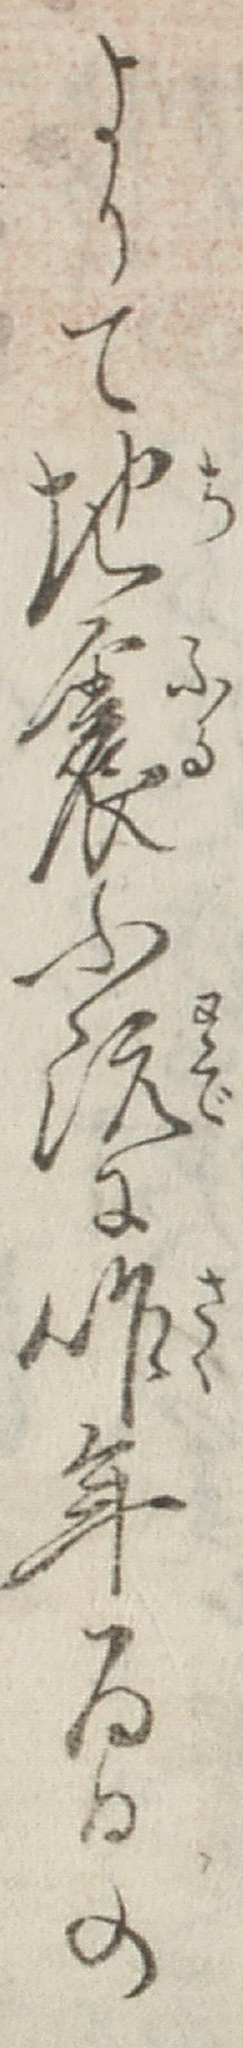よりて地震ふ既に昨年百日の
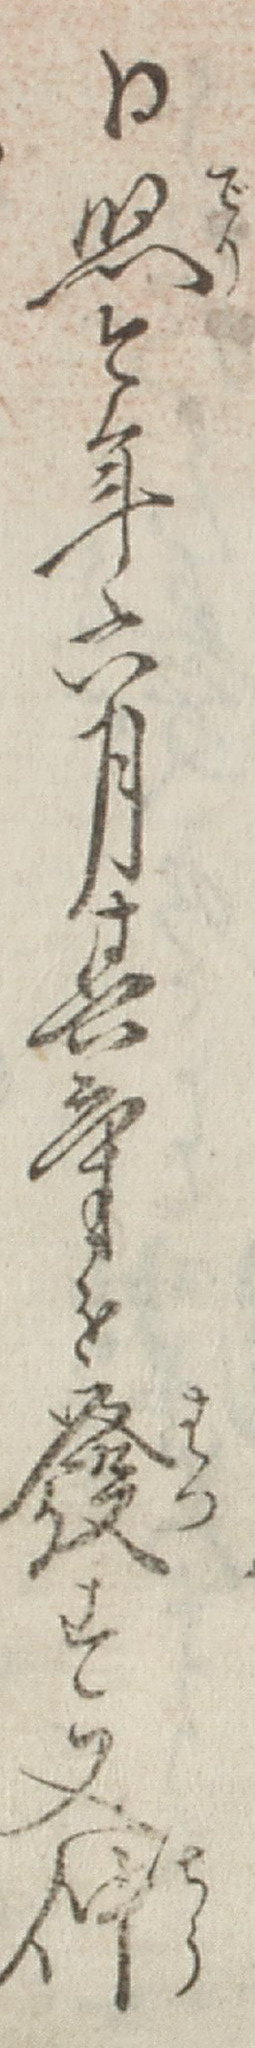日照今年六月其気を発す又仲
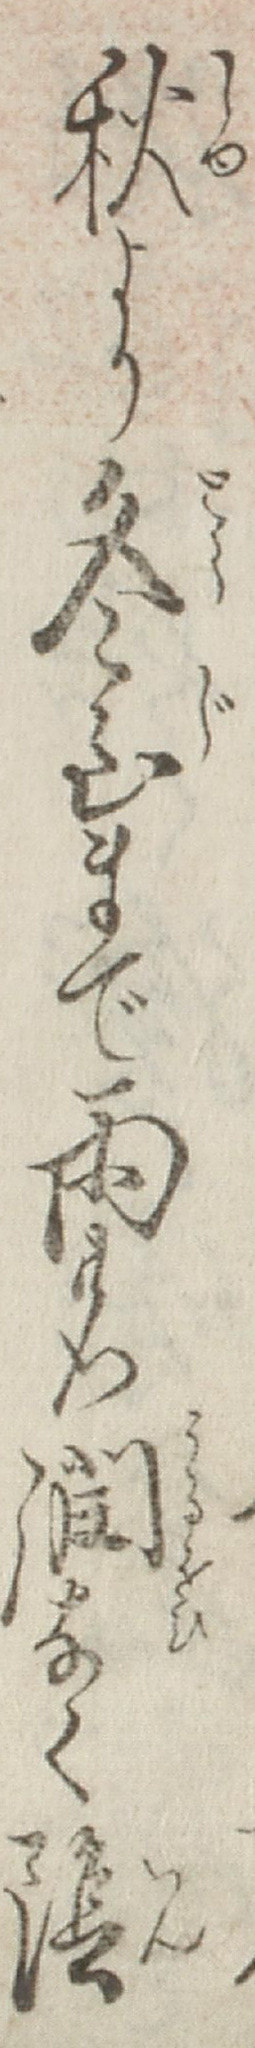秋より冬至まで雨の潤なく陰
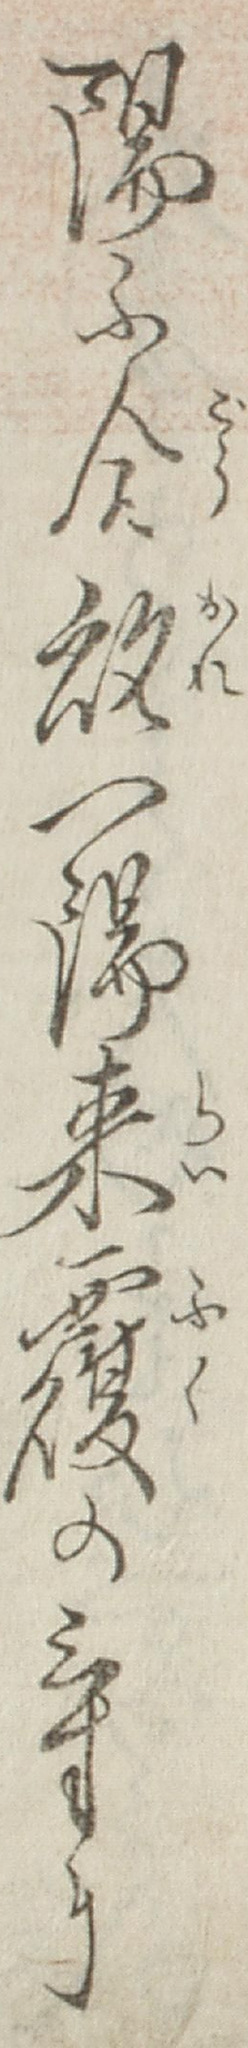陽ふ合故一陽来復の気に
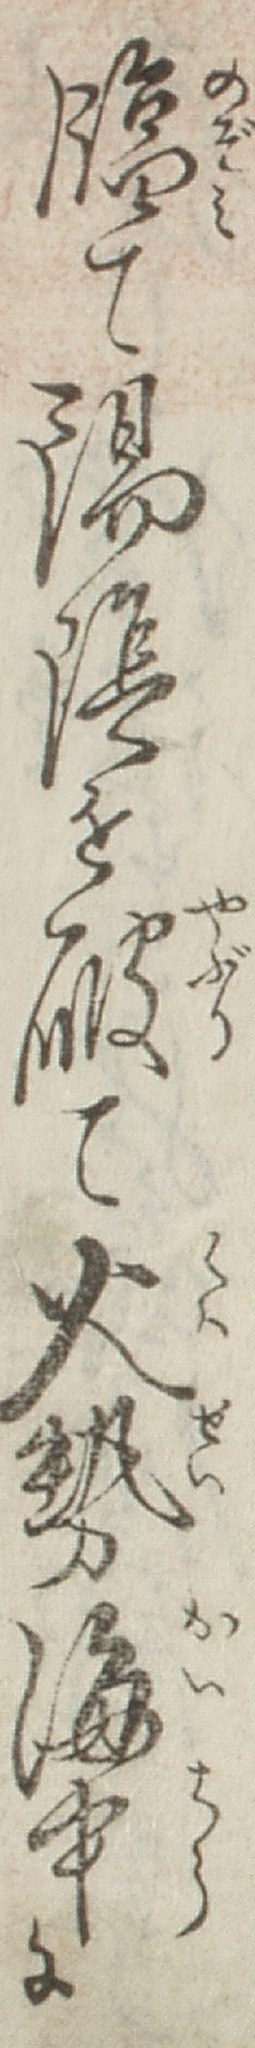臨て陽陰を破て火勢海中に

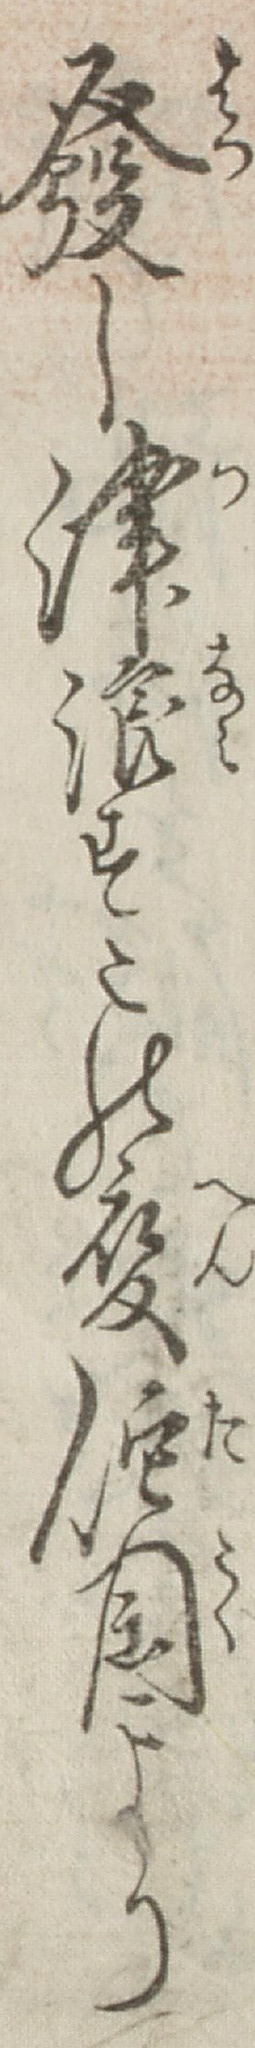発し津浪すこの変他国より
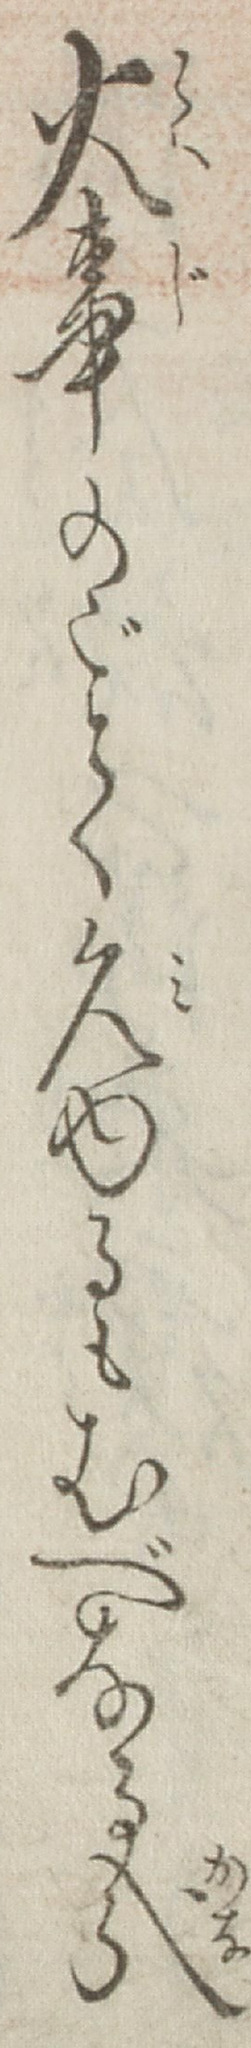火事のごとく見ゆるもむべなる哉
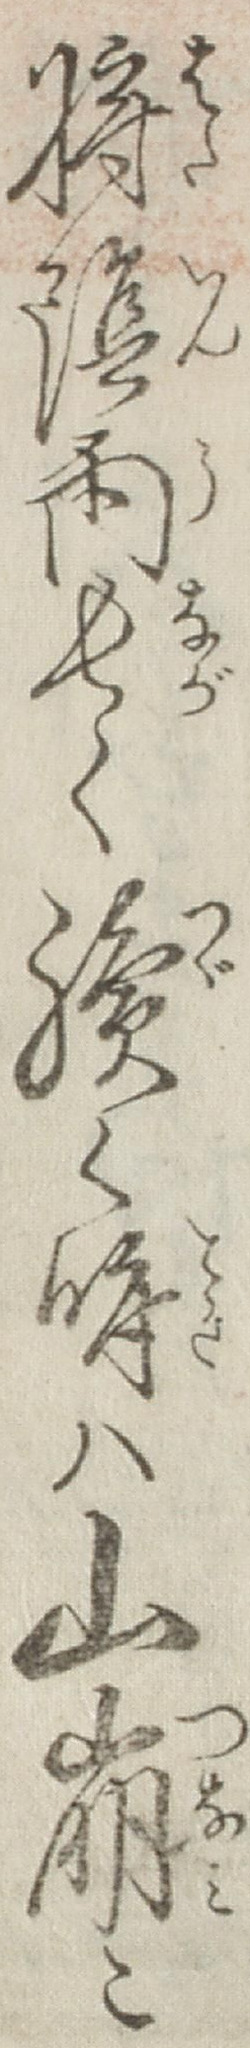将陰雨長く続く時ハ山崩こ
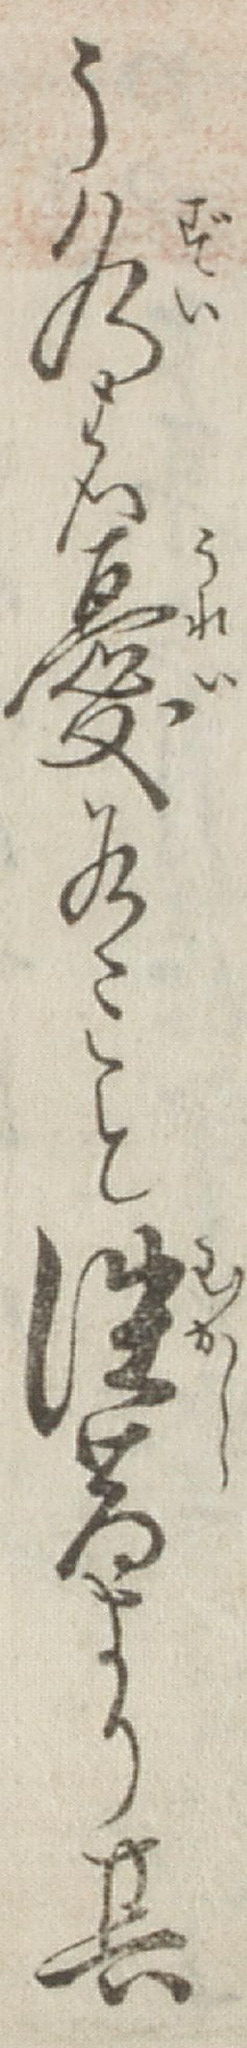う水の憂有こと往昔より其
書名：世直り艸紙
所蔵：東京大学地震研究所図書室 Earthquake Research Institute Library, The University of Tokyo, JAPAN
